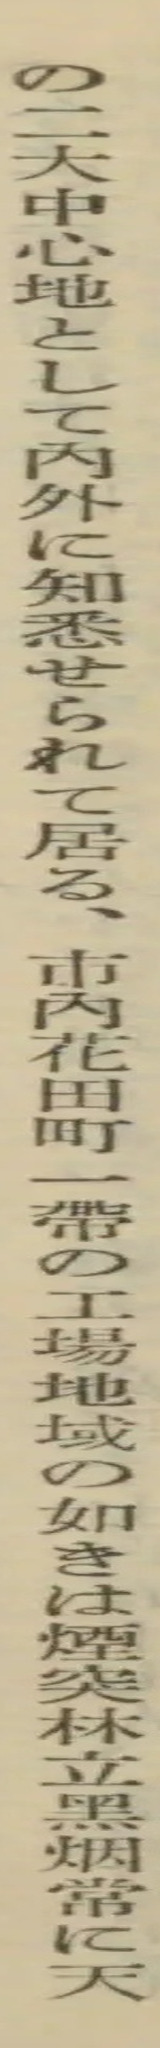の二大中心地として内外に知悉せられて居る、市内花田町一帯の工場地域の如きは煙突林立黒烟常に天
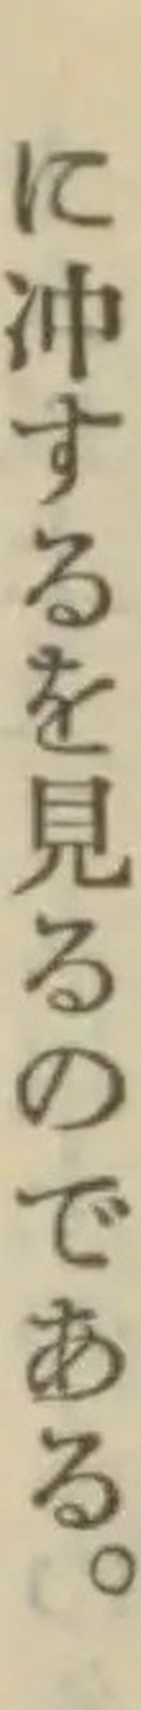に沖するを見るのである。
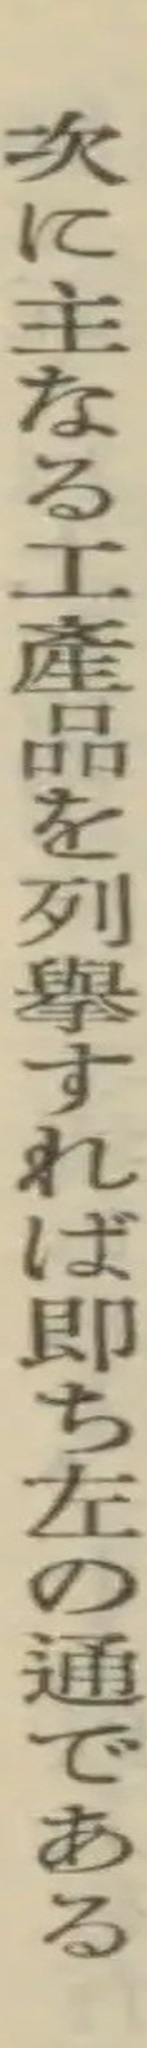次に主なる工産品を列挙すれば即ち左の通である
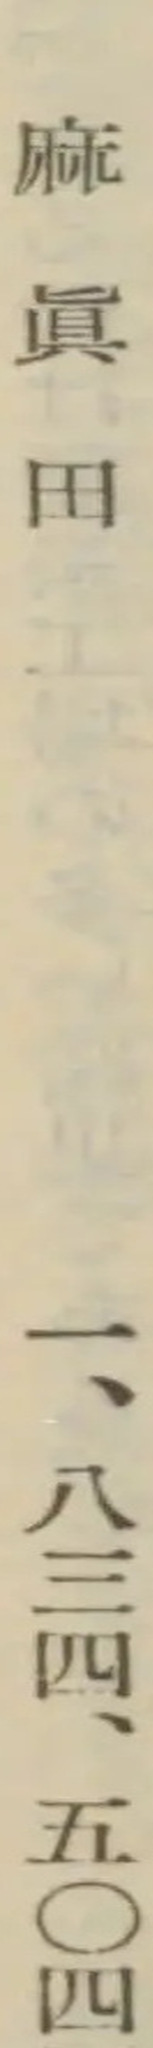麻真田一、八三四、五〇四円
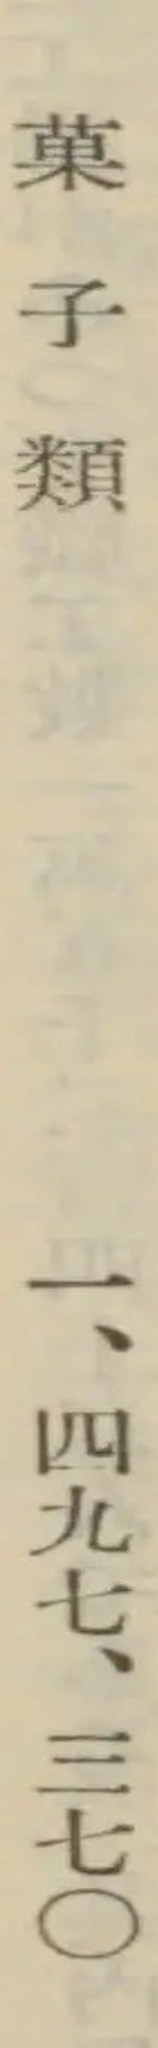菓子類一、四九七、三七〇
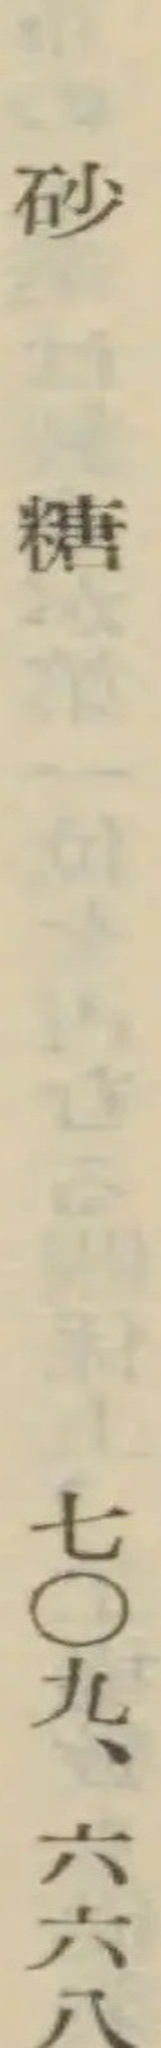砂糖七〇九、六六八
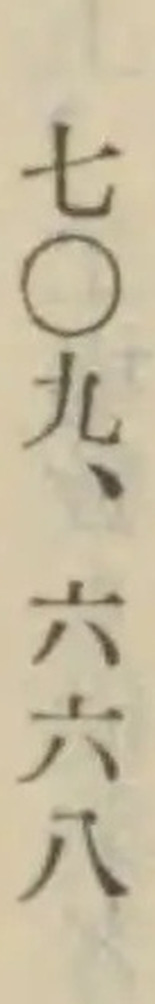砂糖七〇九、六六八
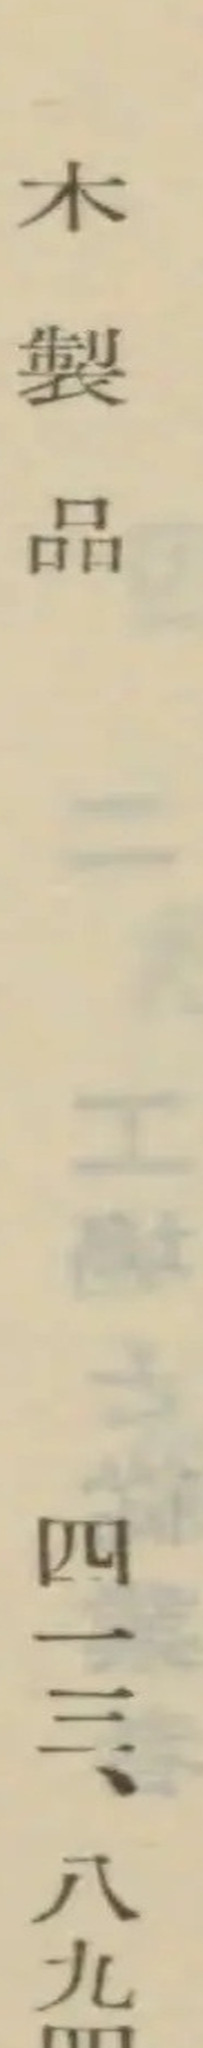木製品四一三、八九四
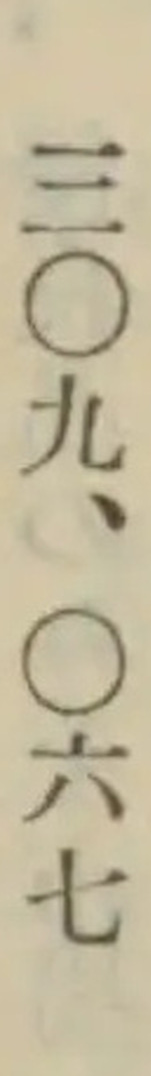酒三〇九、〇六七
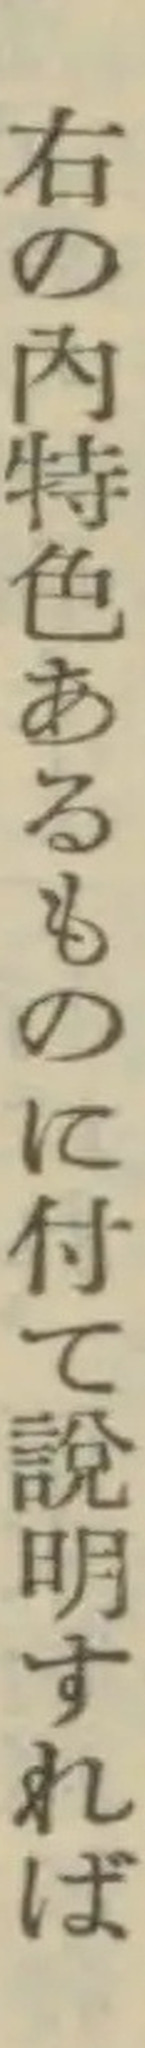右の内特色あるものに付て説明すれば
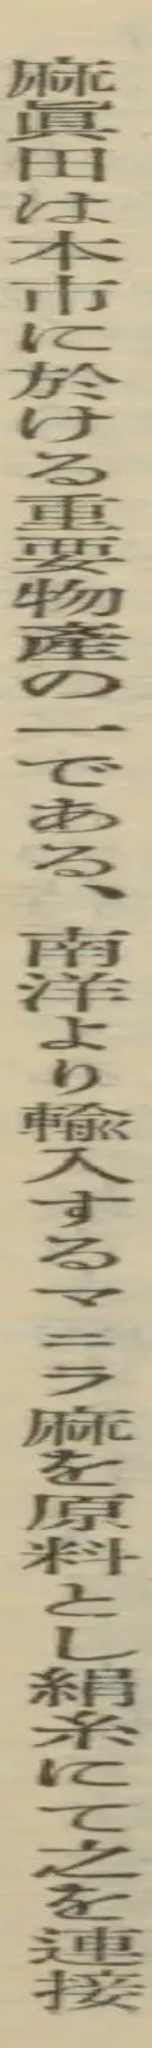麻真田は本市に於ける重要物産の一である、南洋より輸入するマニラ麻を原料とし絹糸にて之を連接
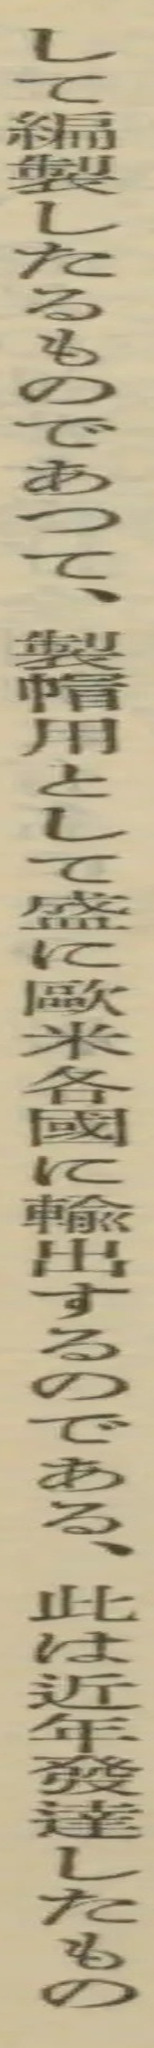して編製したるものであつて、製帽用として盛に欧米各国に輸出するのである、此は近年発達したもの

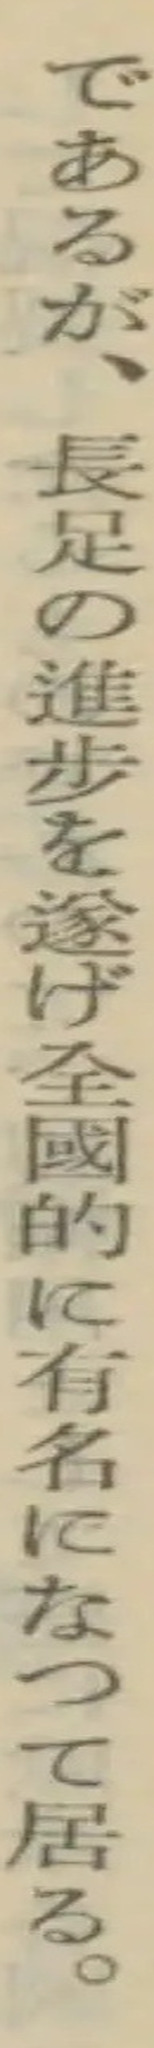であるが、長足の進歩を遂げ全国的に有名になつて居る。
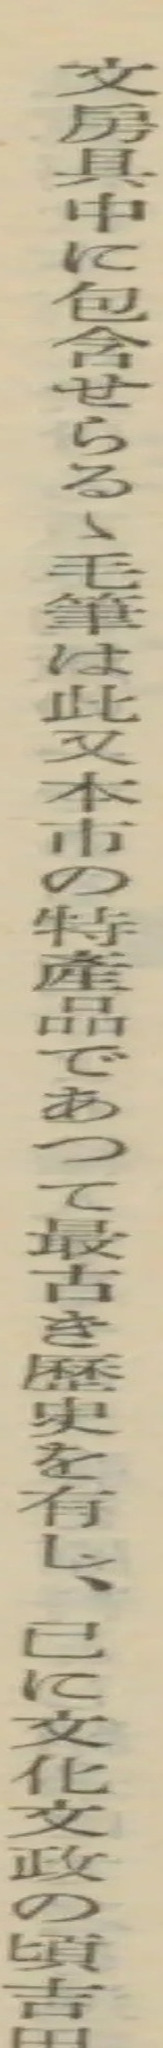文房具中に包含せらるゝ毛筆は此又本市の特産品であつて最古き歴史を有し、已に文化文政の頃吉田
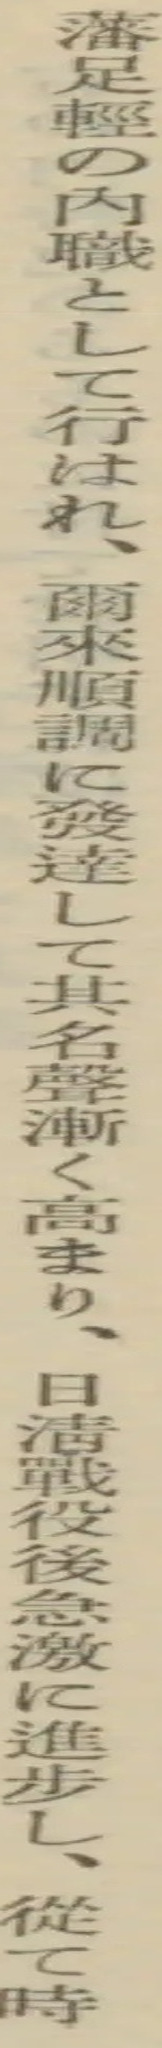藩足軽の内職として行はれ、爾来順調に発達して其名声漸く高まり、日清戦役後急激に進歩し、従て時
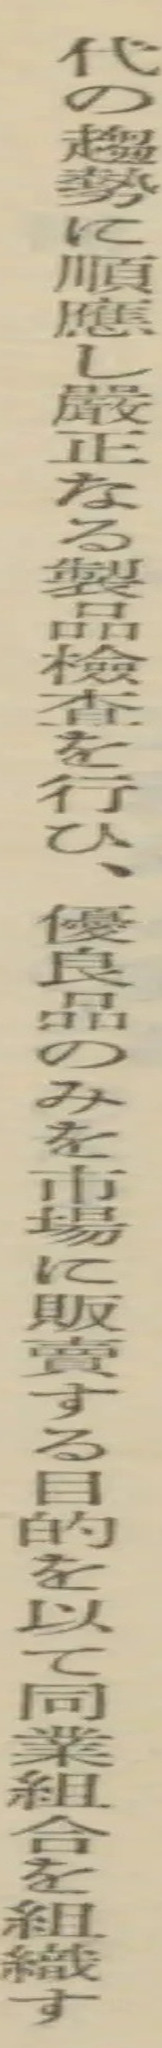代の趨勢に順応し厳正なる製品検査を行ひ、優良品のみを市場に販売する目的を以て同業組合を組織す
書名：産業の豊橋
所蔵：国立国会図書館 National Diet Library, JAPAN
